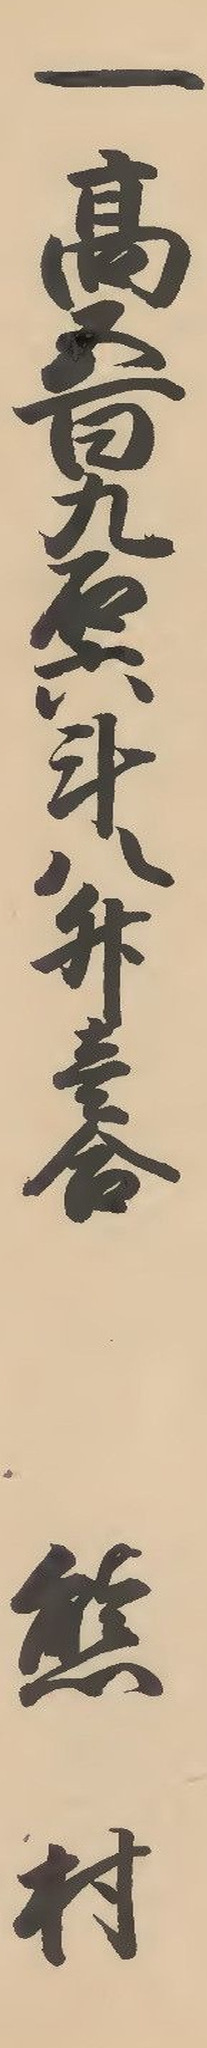一高五百九石六斗八升壱合熊村
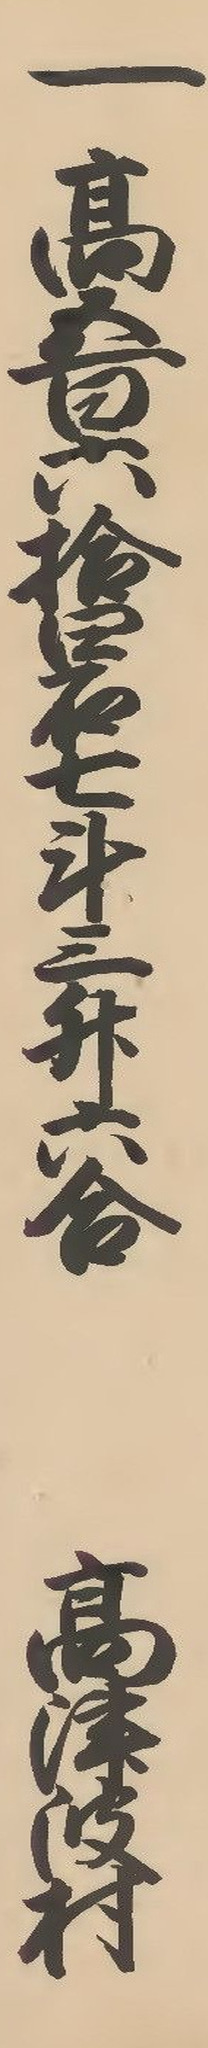一高五百六拾四石七斗三升六合高津波村
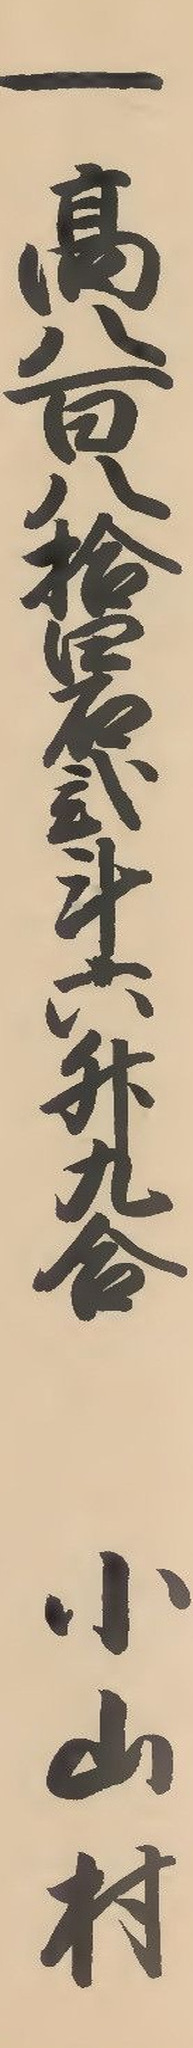一高八百八拾四石弐斗六升九合小山村
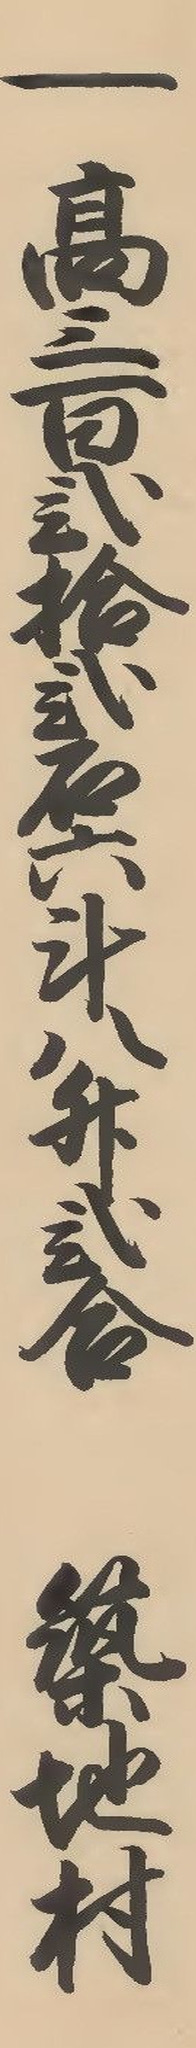一高三百弐拾弐石六斗八升弐合築地村
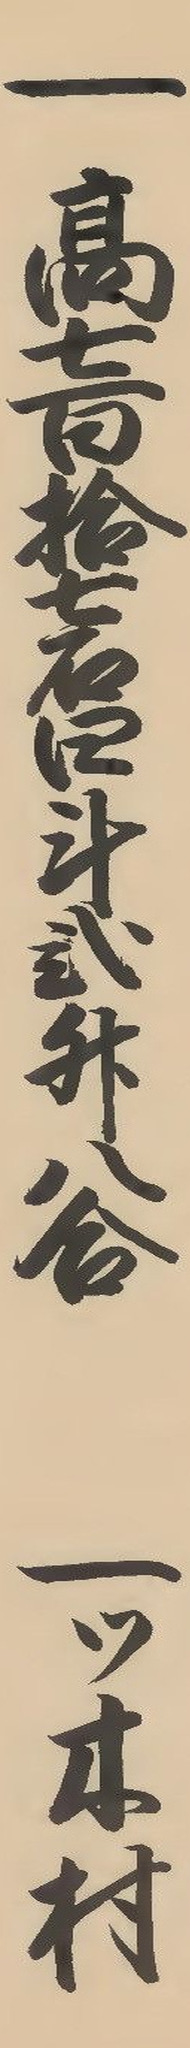一高七百拾七石四斗弐升八合一ツ木村
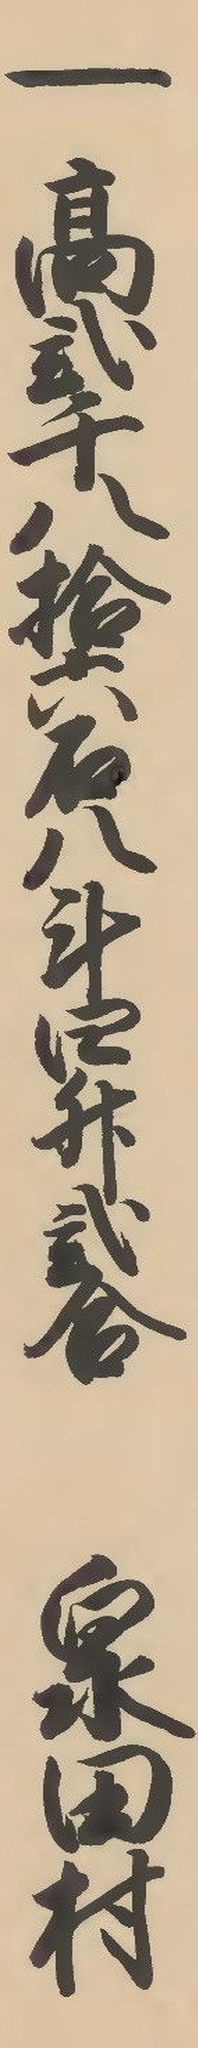一高弐千八拾六石八斗四升弐合泉田村

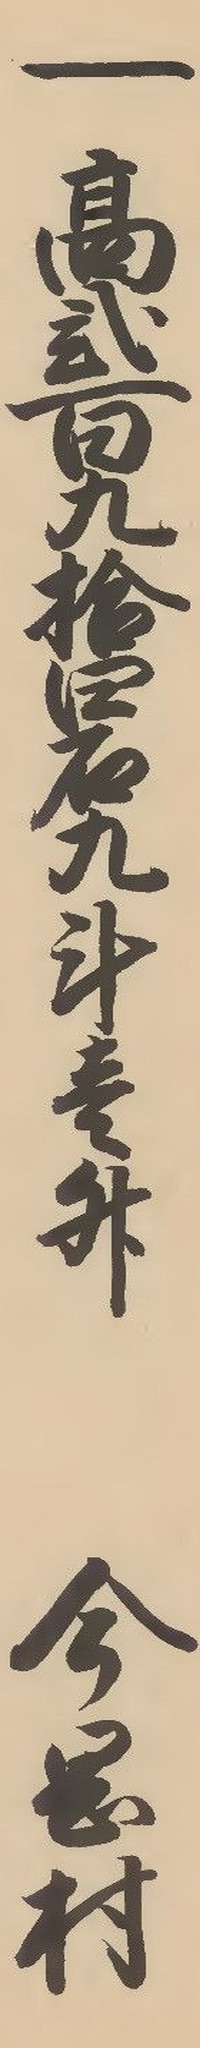一高弐百九拾四石九斗壱升今岡村
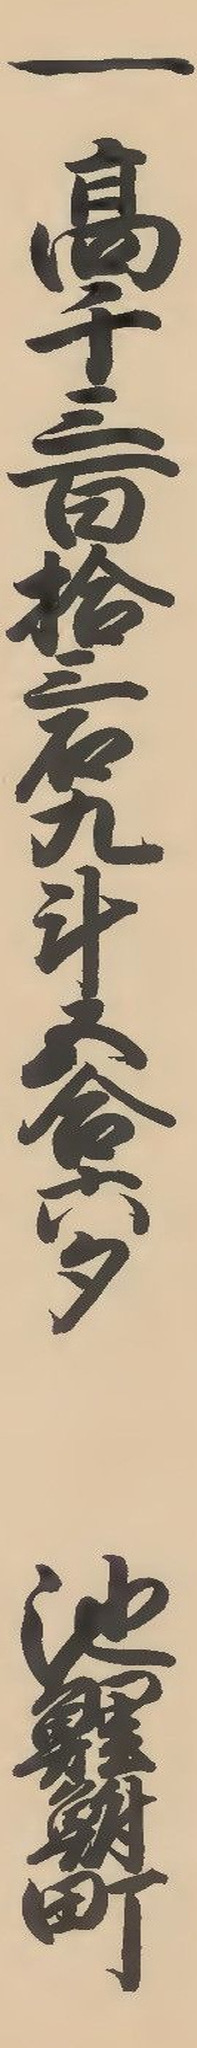一高千三百拾三石九斗五合六勺池鯉鮒町
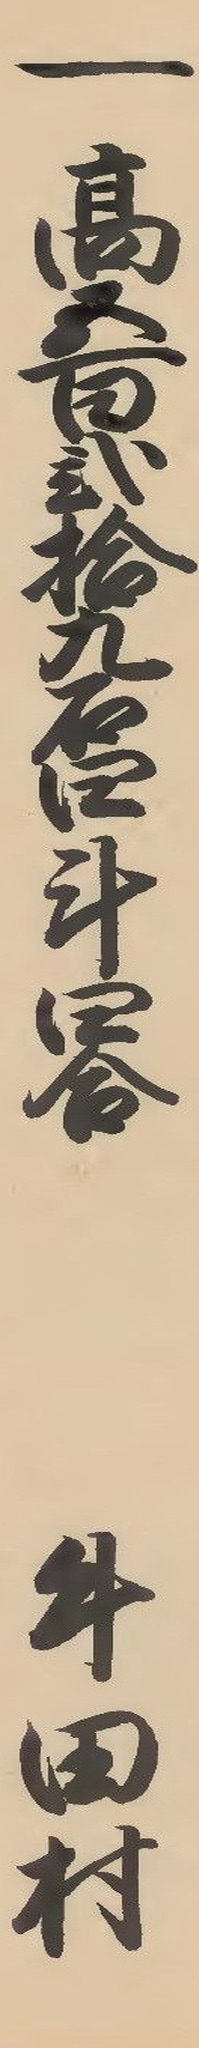一高五百弐拾九石四斗四合牛田村
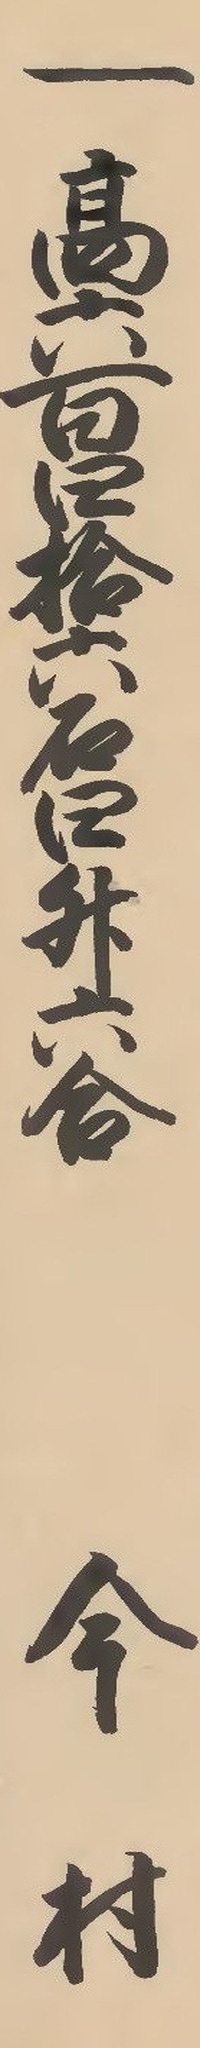一高六百四拾六石四升六合今村
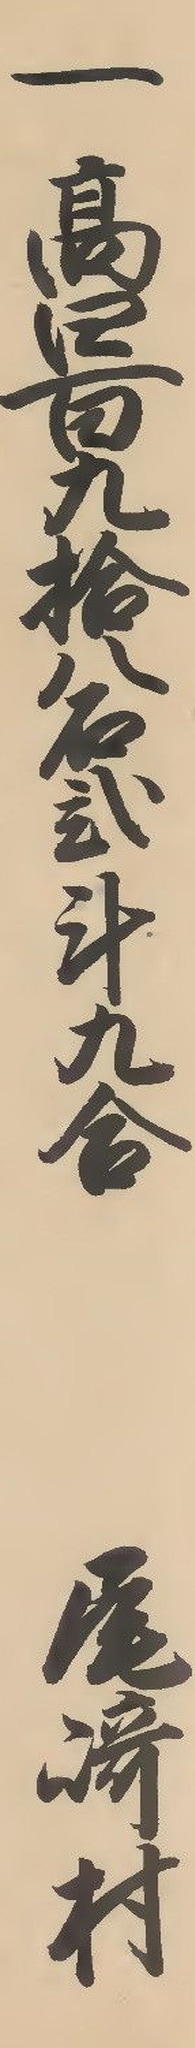一高四百九拾八石弐斗九合尾崎村
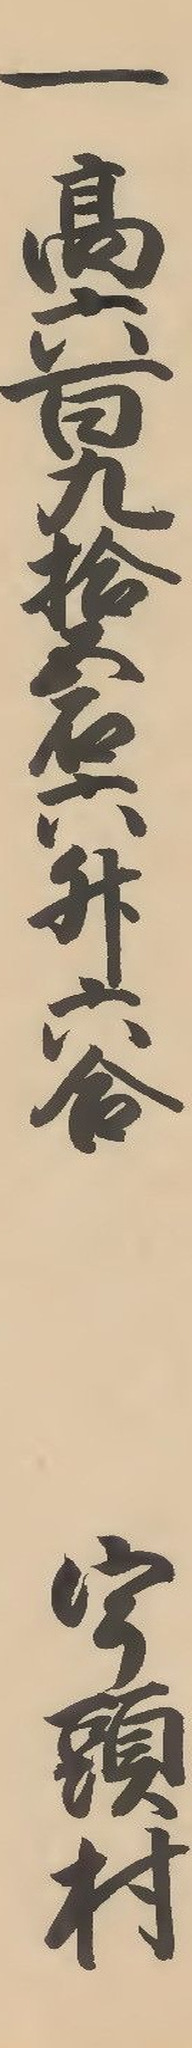一高六百九拾五石六升六合宇頭村
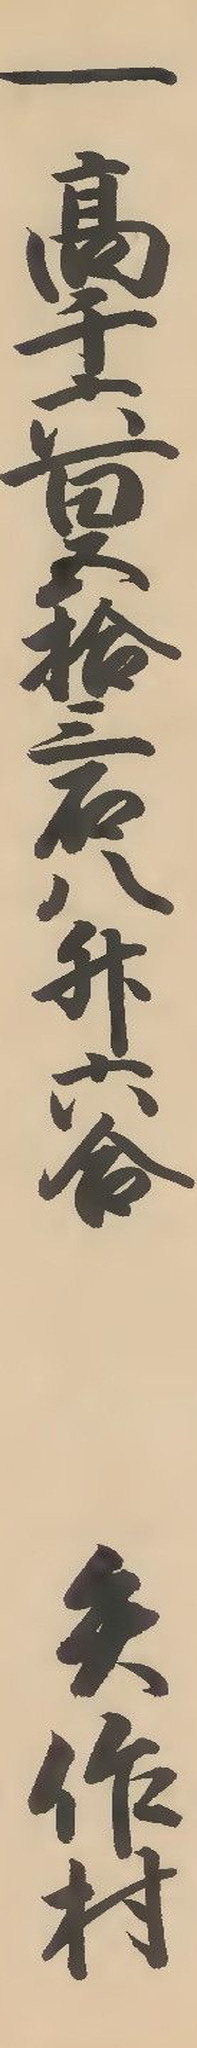一高千六百五拾三石八升六合矢作村
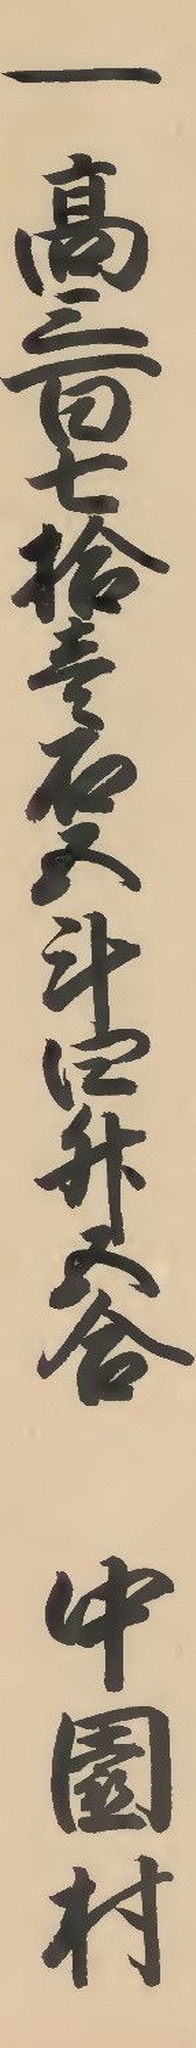一高三百七拾壱石五斗四升五合中園村

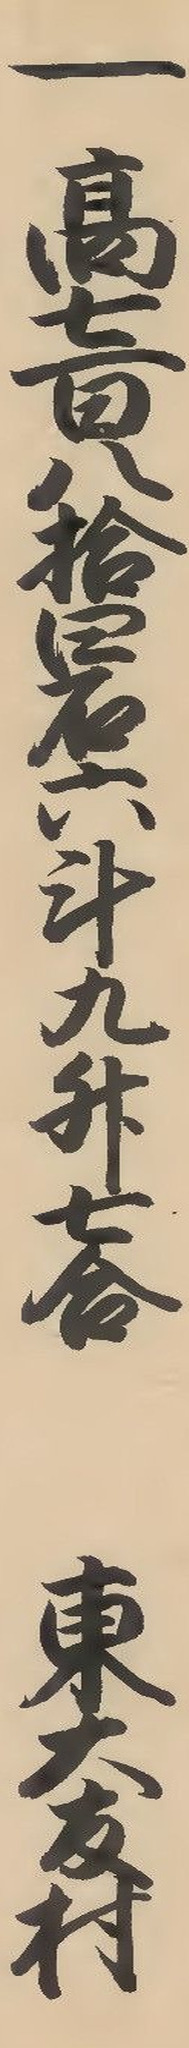一高七百八拾四石六斗九升七合東大友村
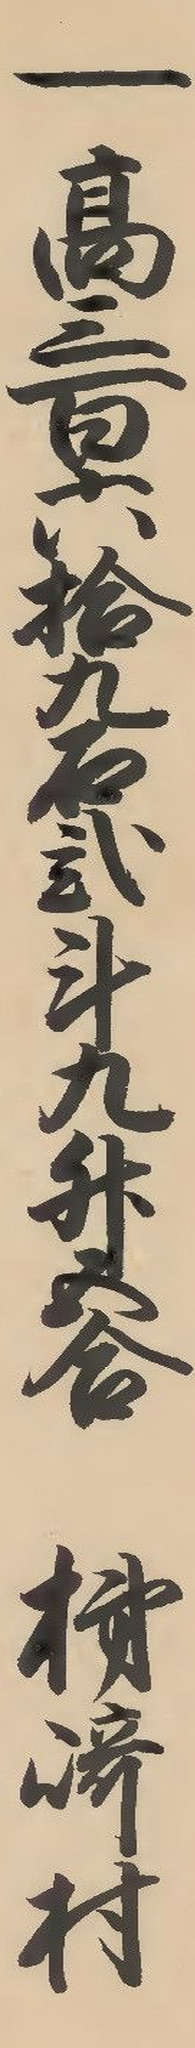一高三百六拾九石弐斗九升五合柿崎村
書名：三河国郷帳
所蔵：国立公文書館 National Archives of Japan
